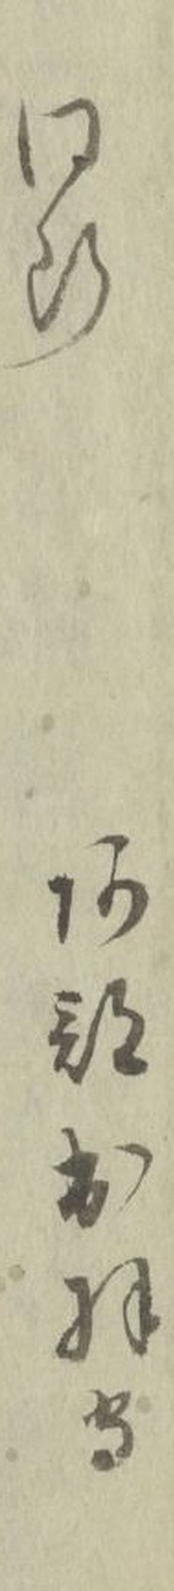同断阿部出羽守
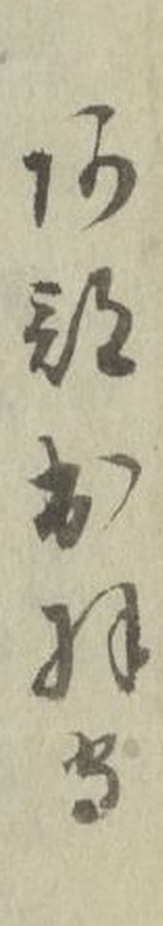同断阿部出羽守
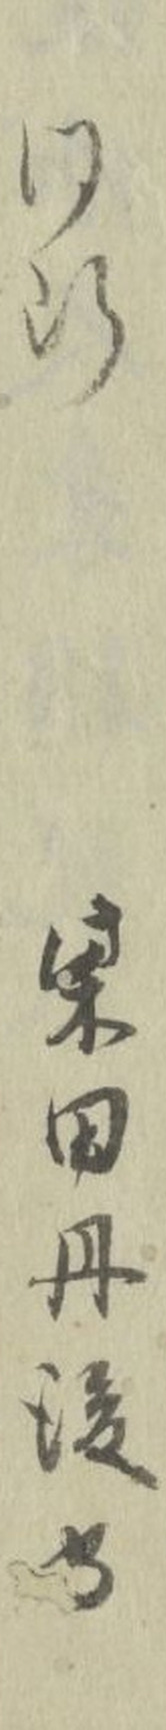同断柴田丹後守
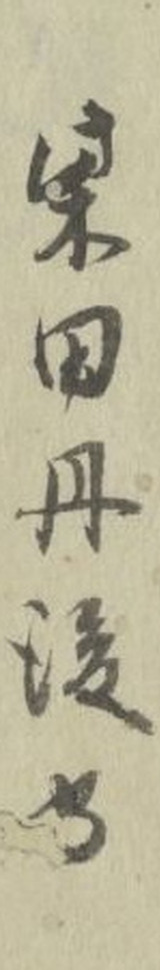同断柴田丹後守
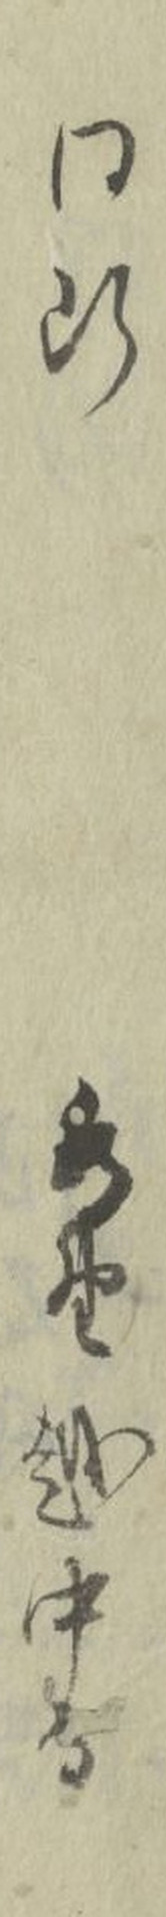同断水野越中守
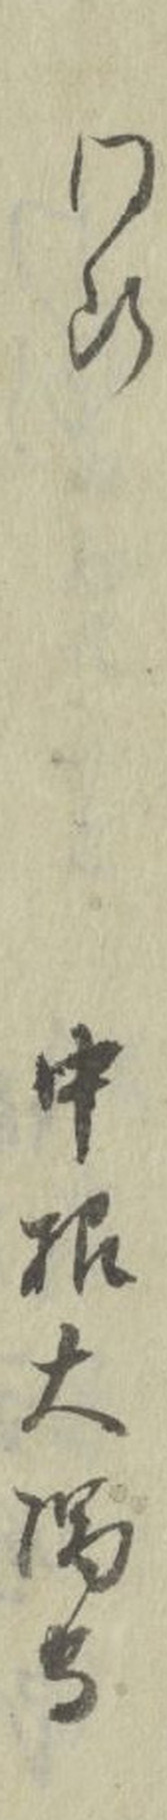同断中根大隅守
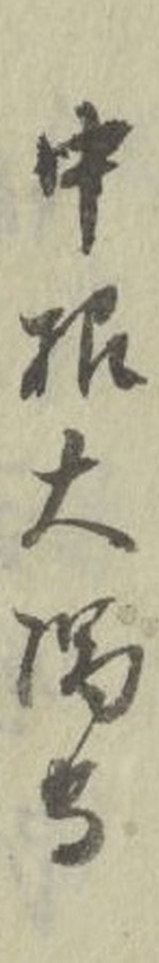同断中根大隅守
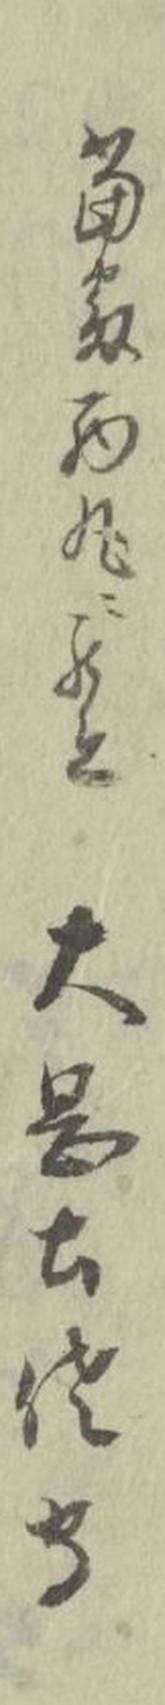当番西丸に罷在大岡土佐守
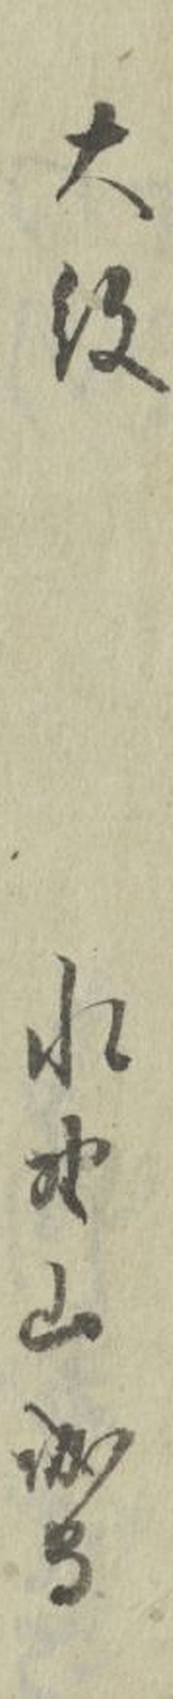大紋水野山城守
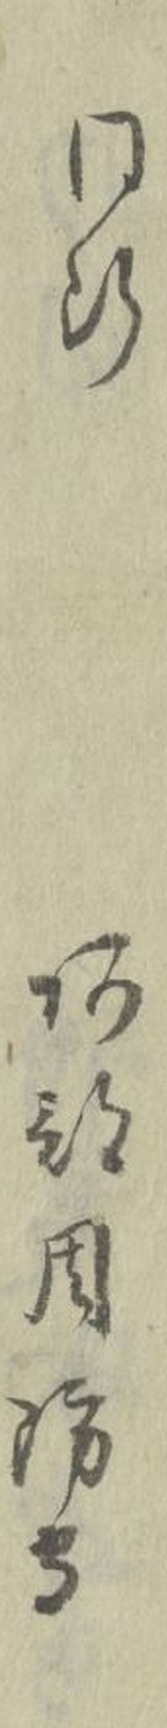同断阿部周防守

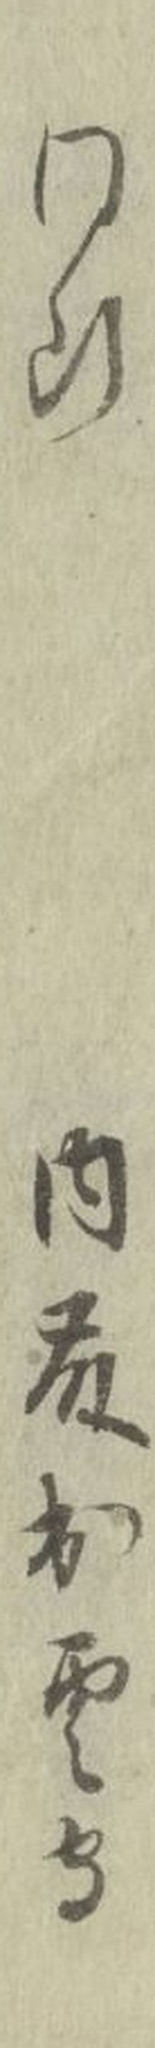同断内藤出雲守
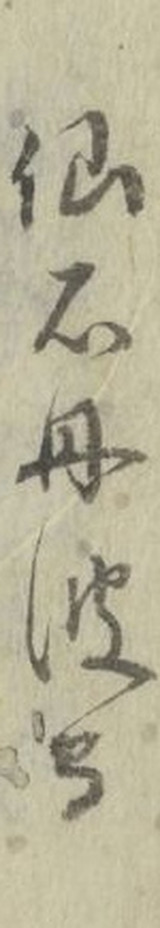同断仙石丹波守
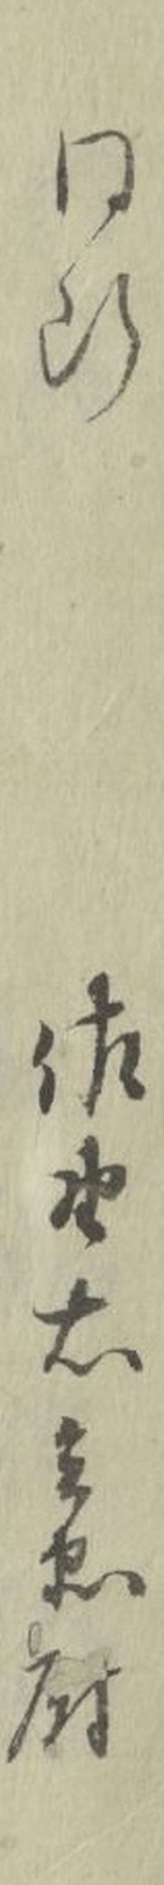同断佐野右兵衛尉
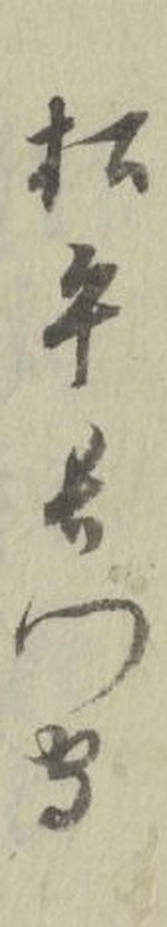同断松平下野守
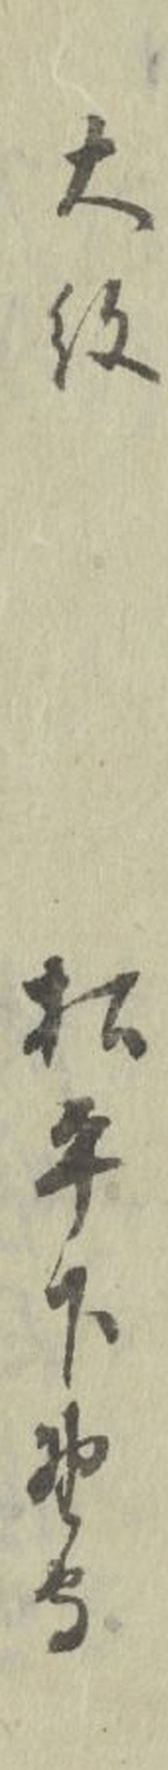同断松平下野守
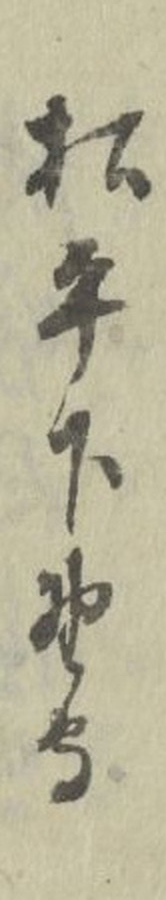同断松平下野守
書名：琉球来朝記 自八至十四終
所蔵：University of the Ryukyus Library
